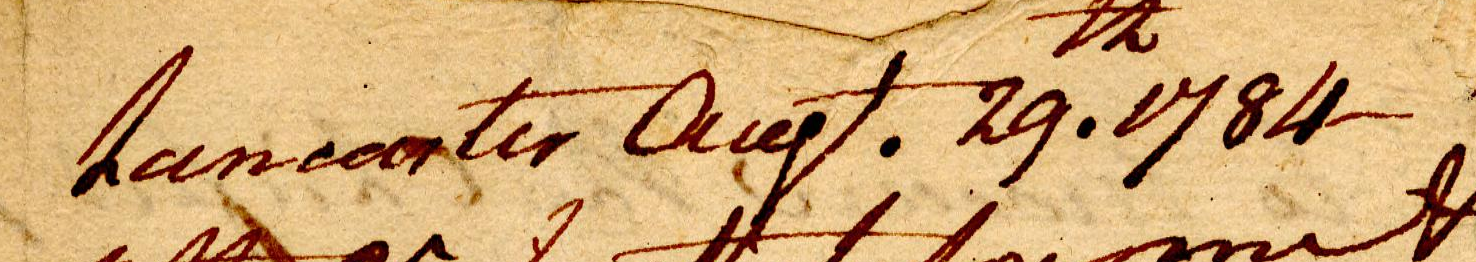Lancaster Aug^t. 29^th. 1784
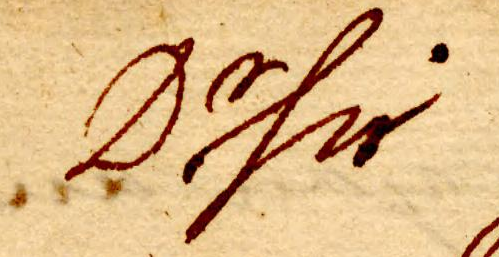D^r Sir
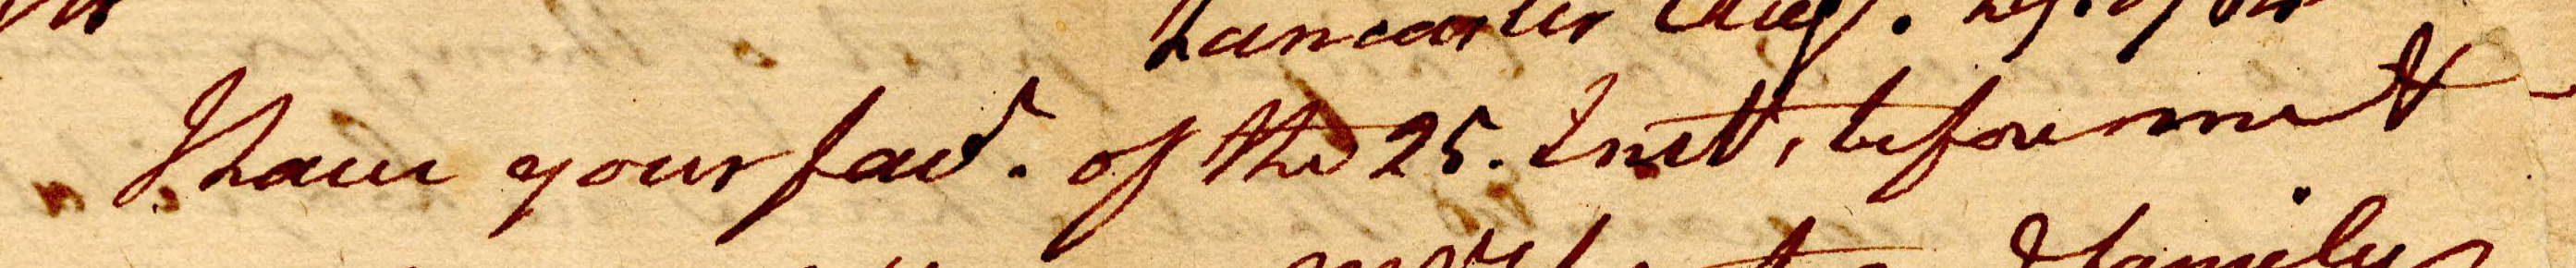I have your fav^r. of the 25.Inst^t. before me &
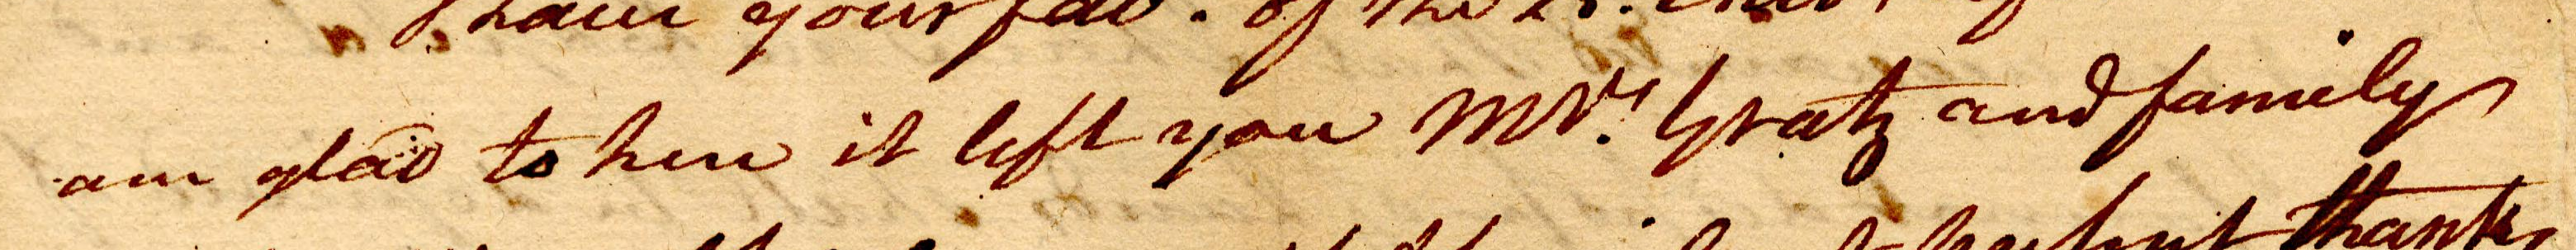am glad to here it left you Mr^rs. Gratz and family
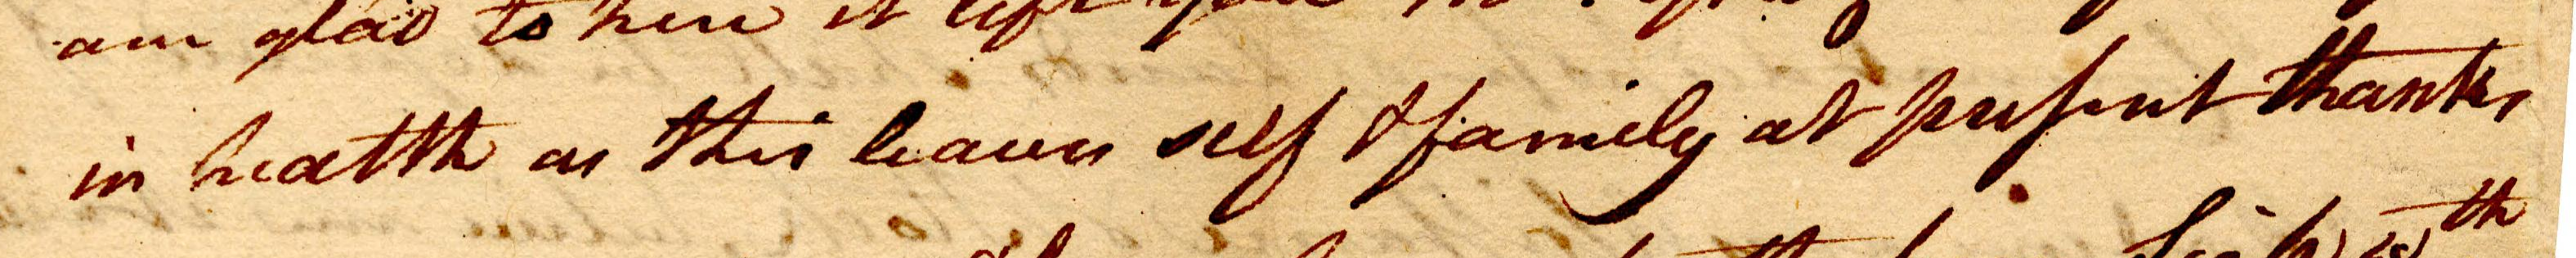in health as this leaves self & family at present thanks
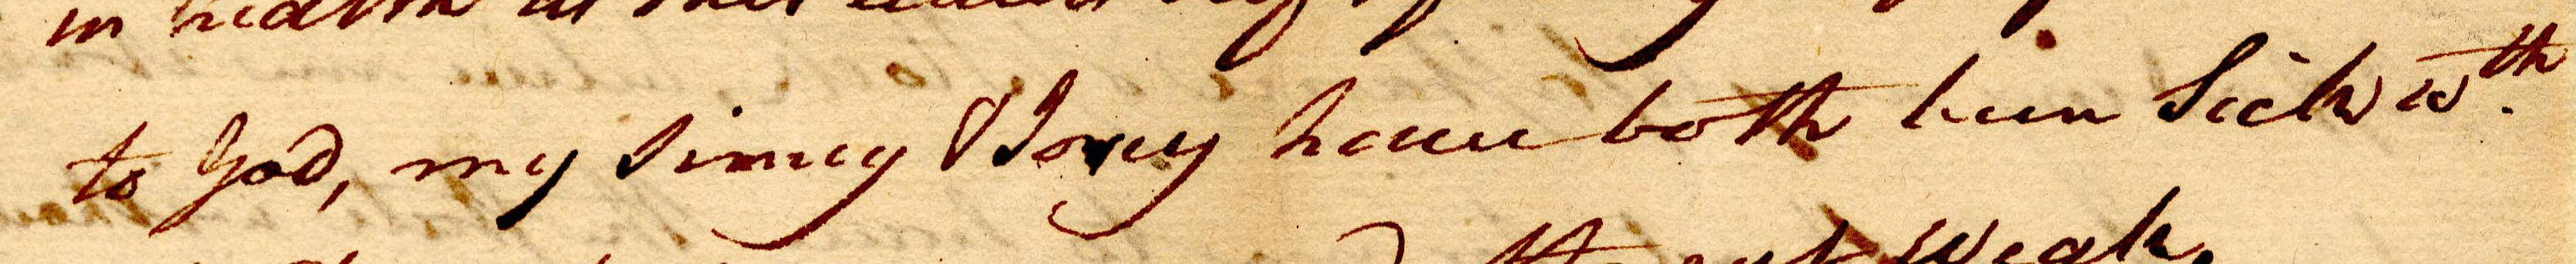to God, my Simey & Josey have both been Sick w^th.
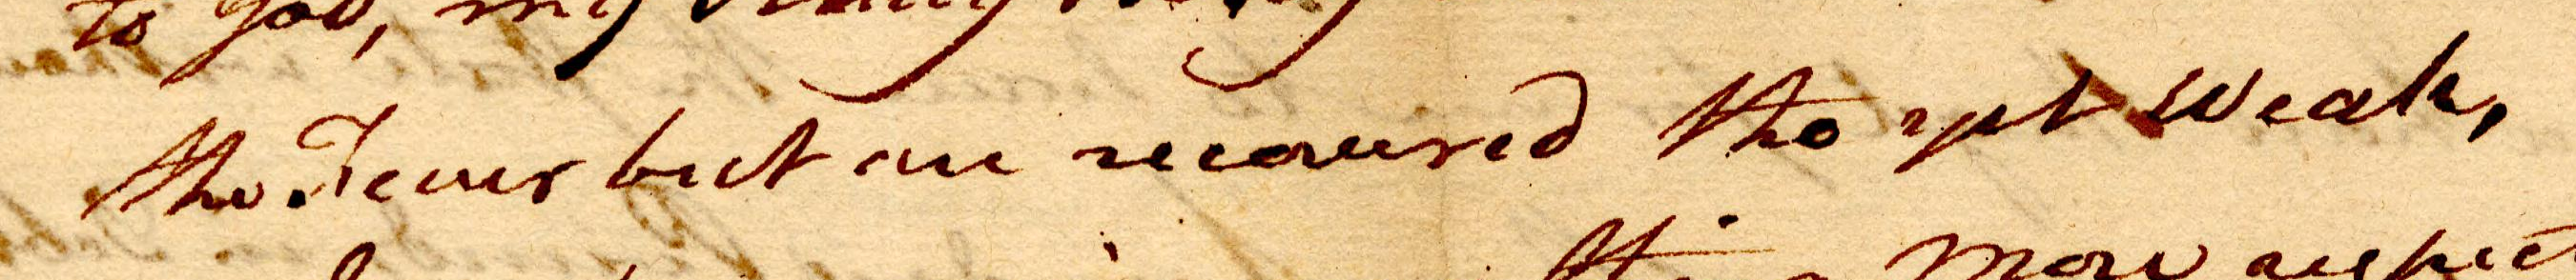the Fever but are recovered tho yet weak,
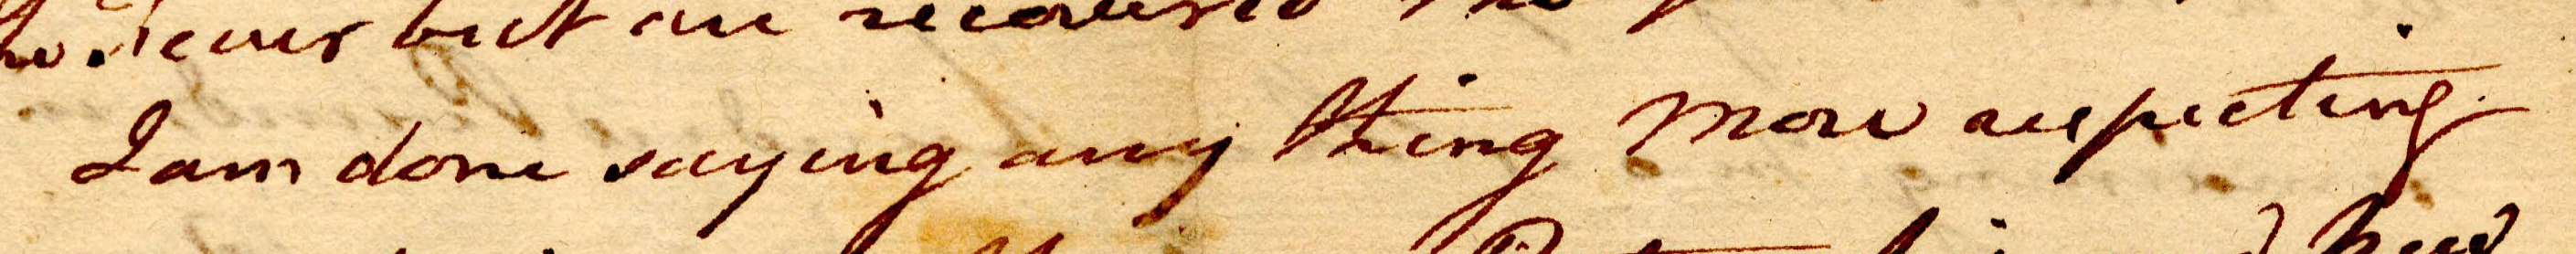I am done saying any thing more respecting
